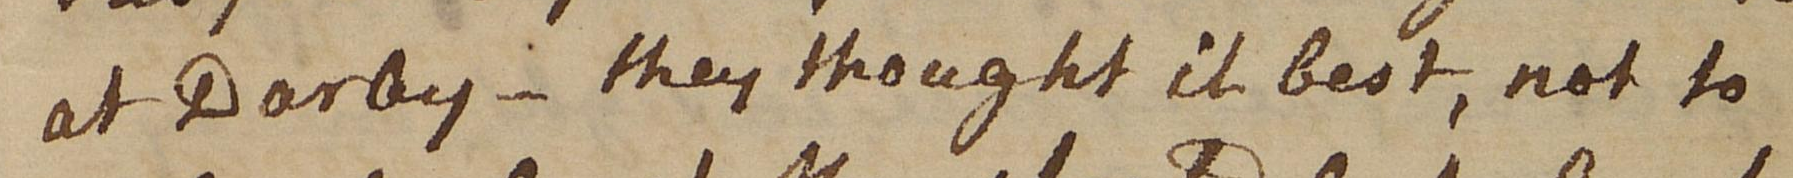at Darby- they thought it best, not to
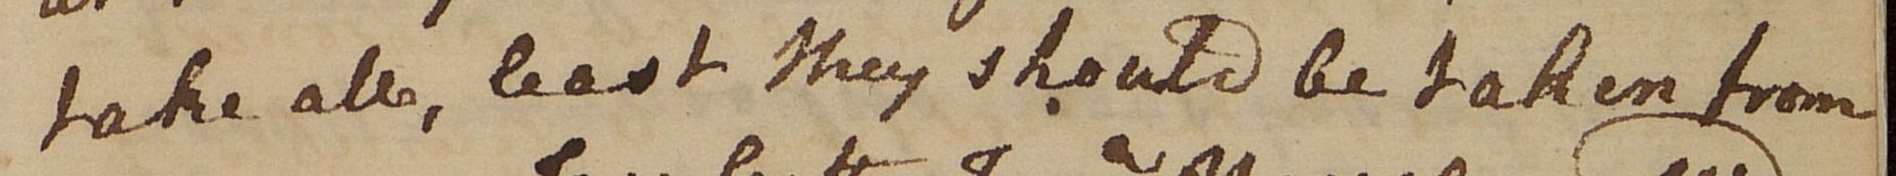take all, least they should be taken from
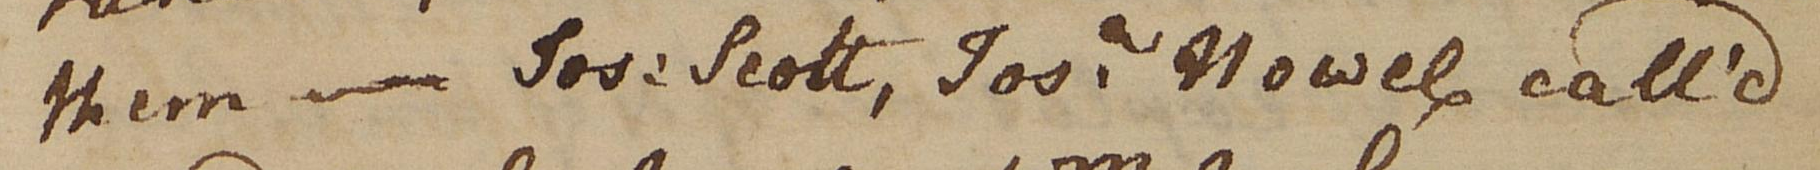them- Jos: Scott, Jos^a. Howel call'd
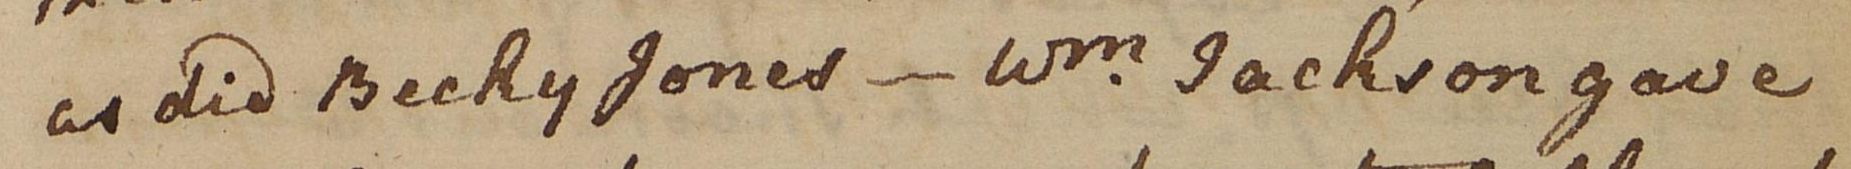as did Becky Jones- W^m. Jackson gave
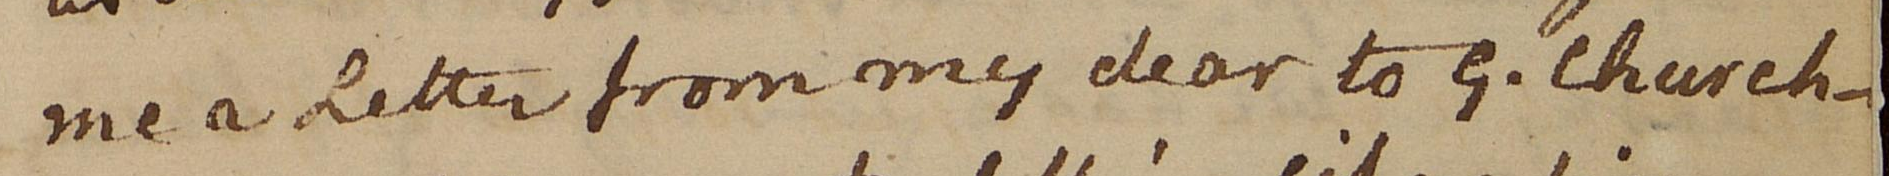me a Letter from my dear to G. Church-
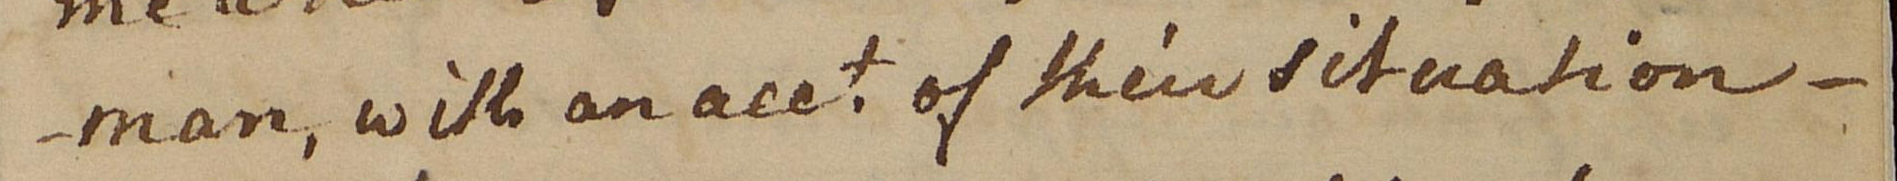-man, with an acc^t. of their situation-
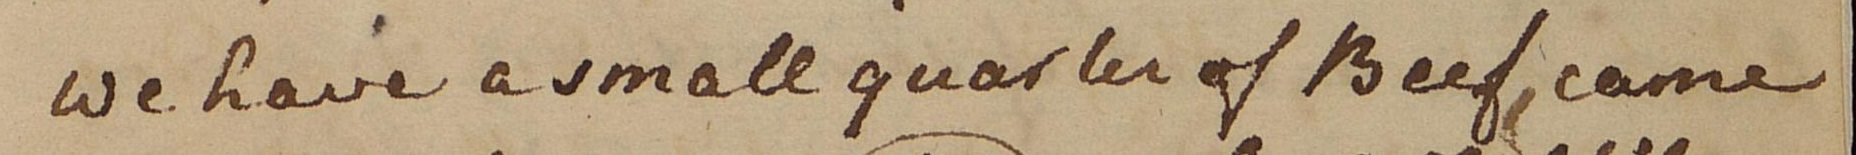we have a small quarler of Beef, came
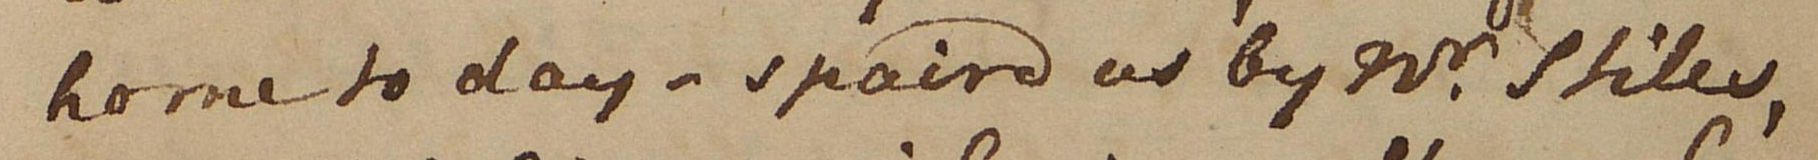home to days - spaird us by W^m. Stiles,
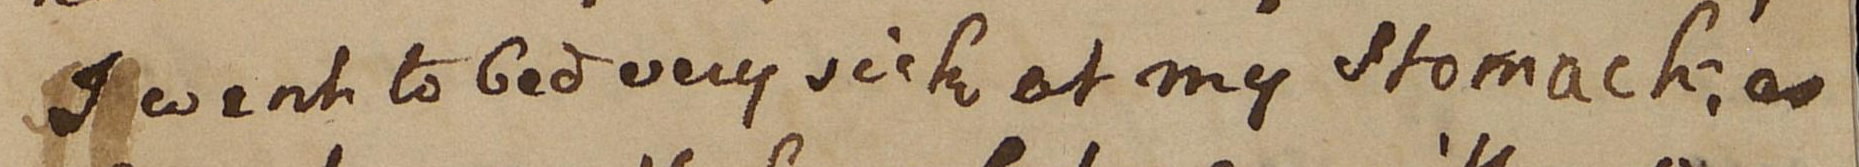I went to bed very sick at my stomach: as
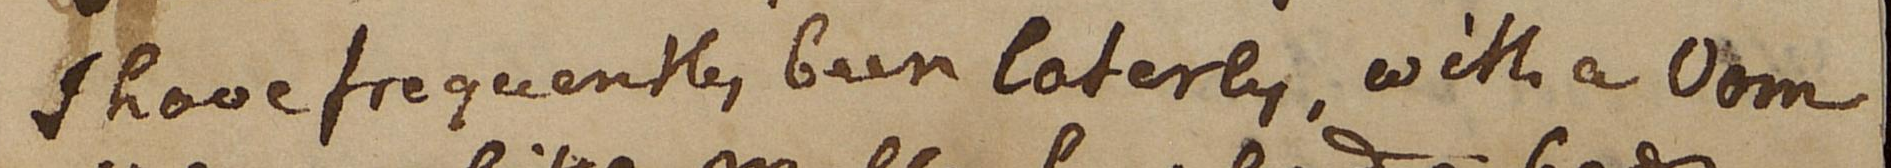I have frequently been laterly, will a Vom
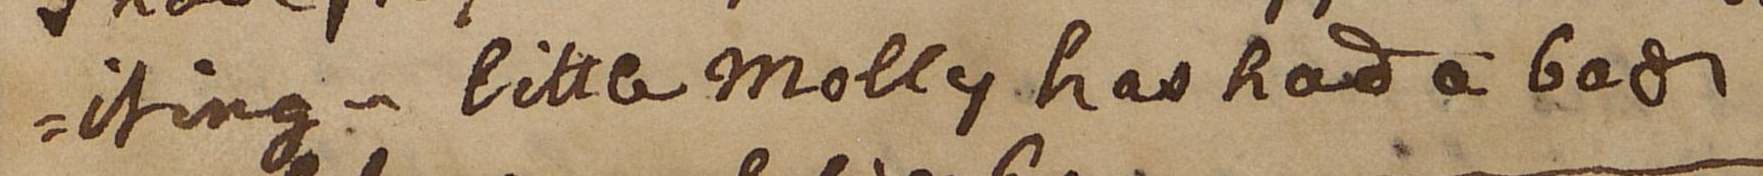-iting- little Molly has had a bad
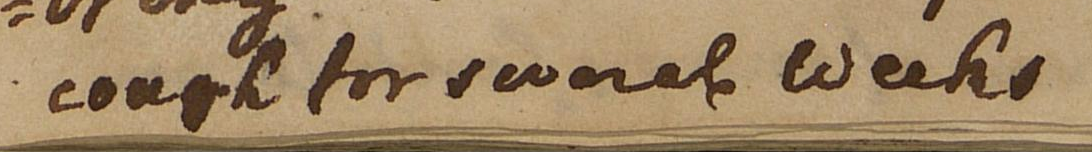cough for several weeks
